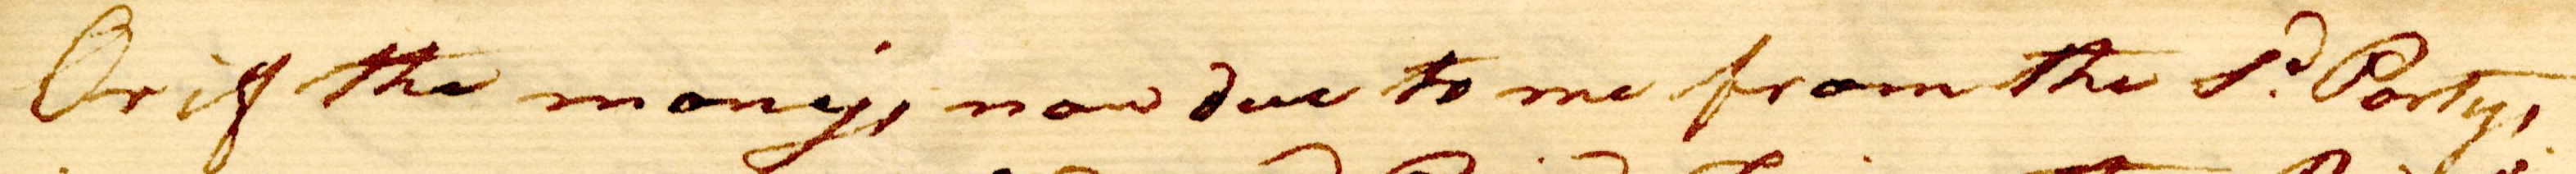Or if the moneys now due to me from the s^d. Partys
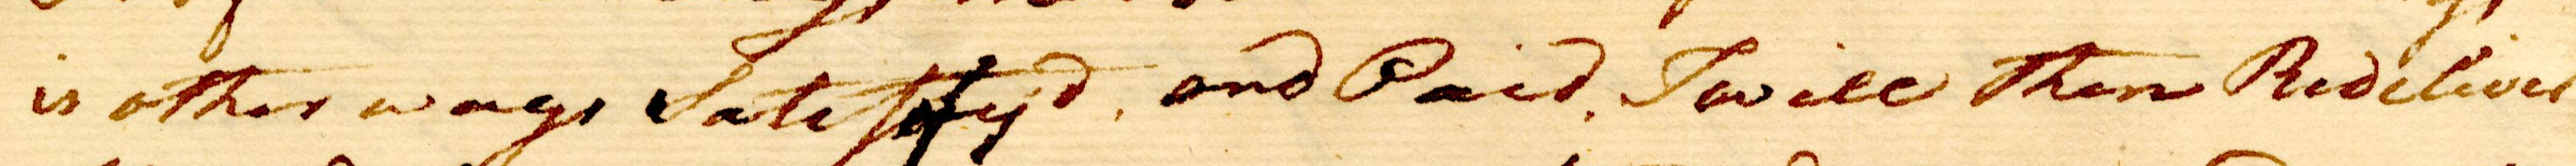is other ways Satissfy'd, and Paid, I will then Redeliver
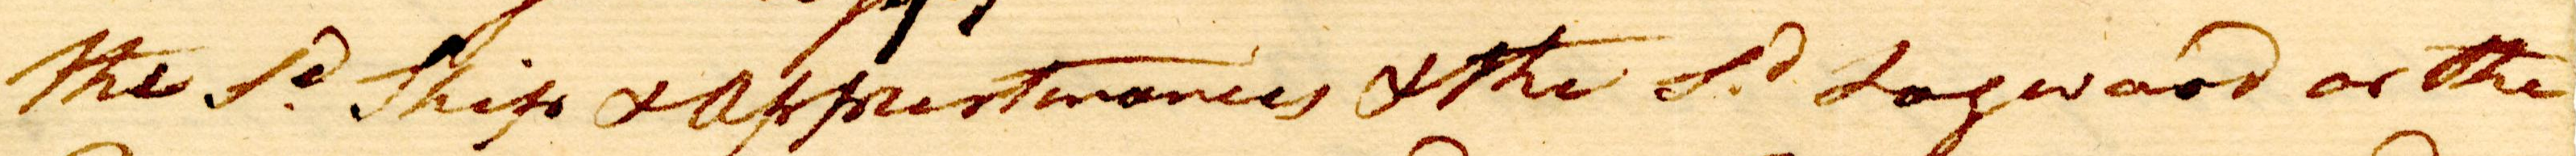the s^d. Ships & appurtenances & the s^d. Logwood or the
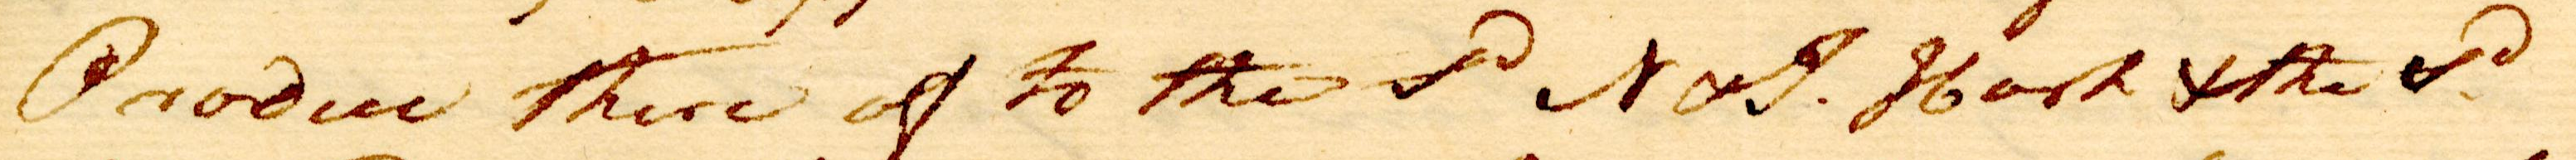Produce there of to the S^d N & I Hart & the s^d
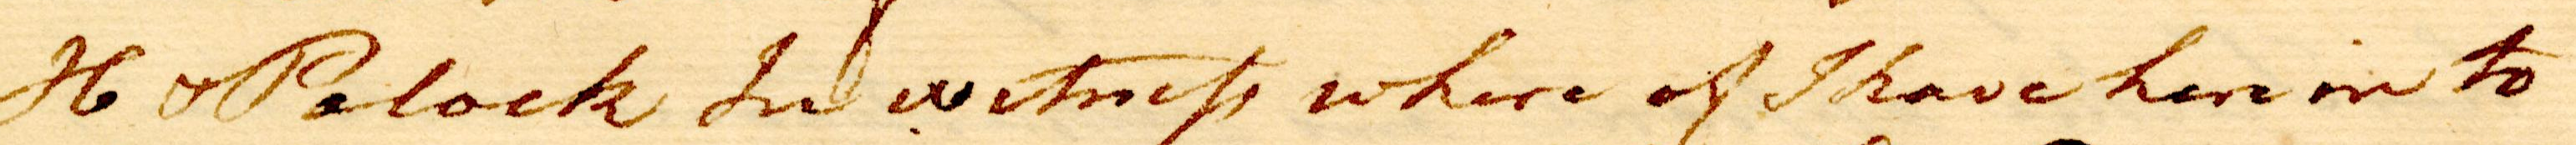H & Palock In witness where of I have here in to
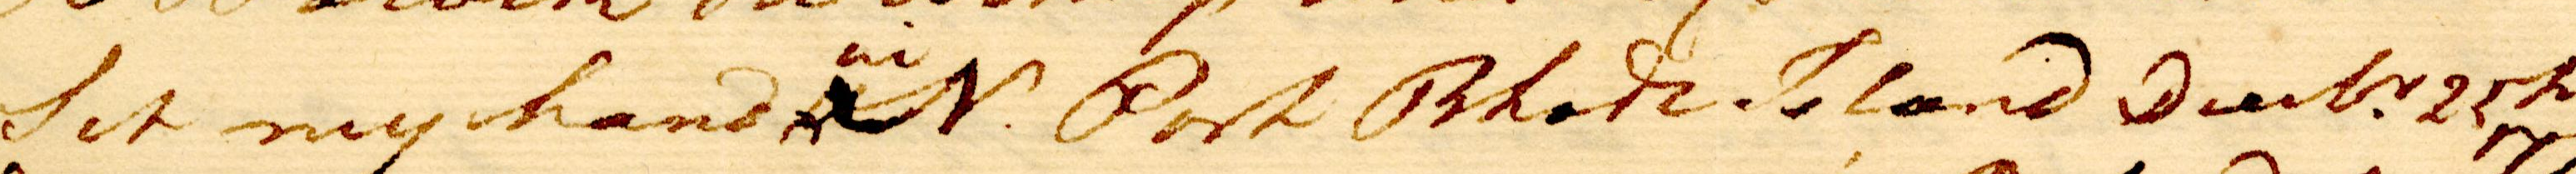set my hand in N. Port Rhode Island Dec^br 25^th
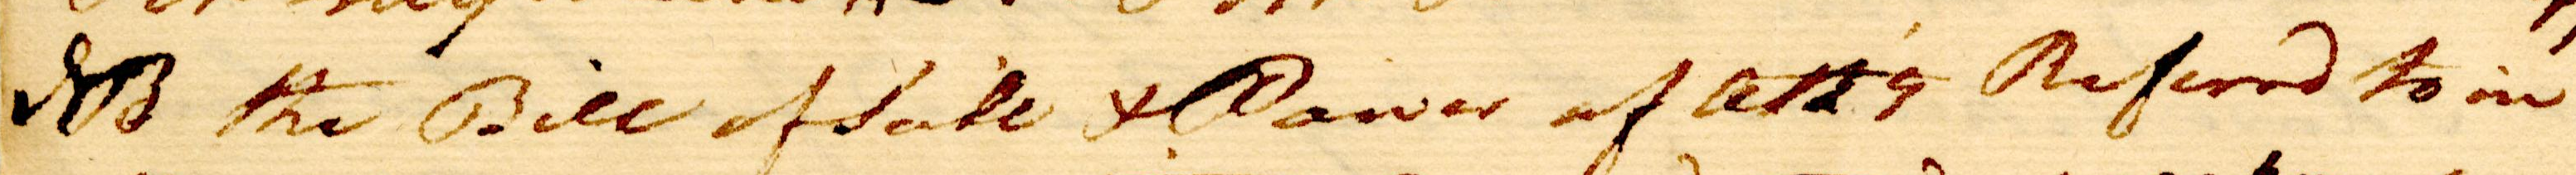NB the Bill of sale & power of att^y Referrd to in
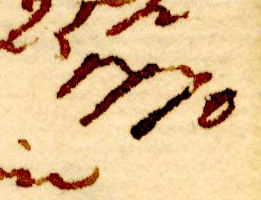1770
